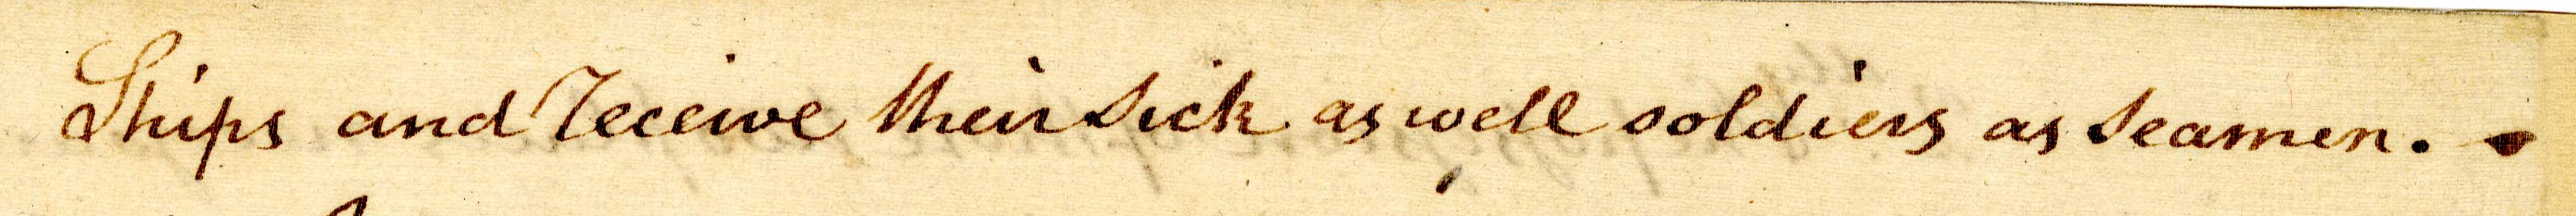Ships and receive their Sick as well soldiers as Seamen.
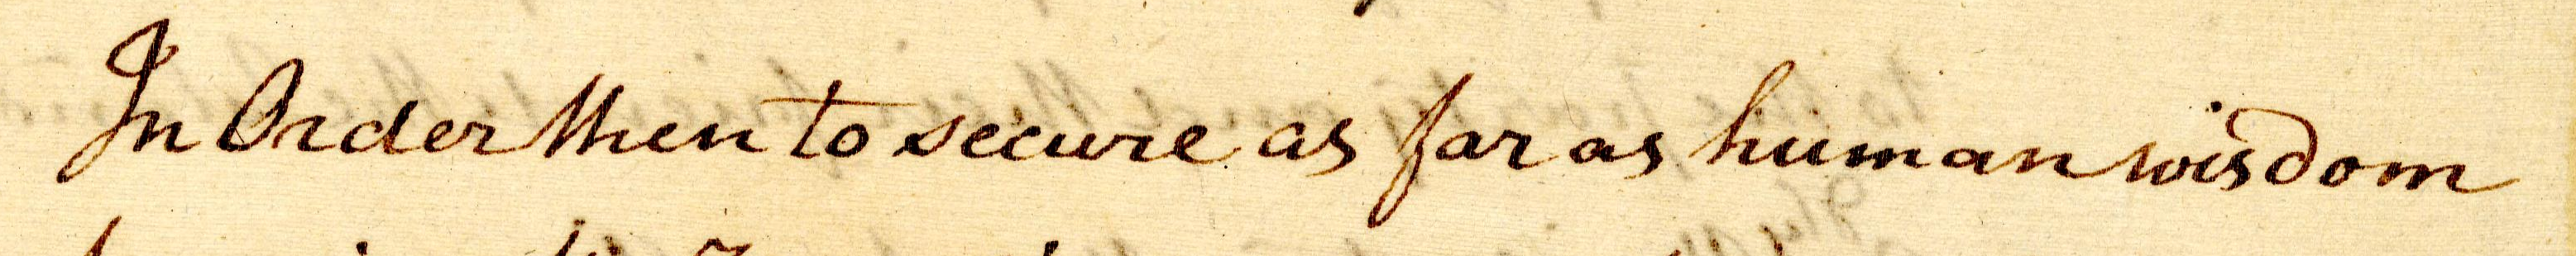In Order then to secure as far as human wisdom
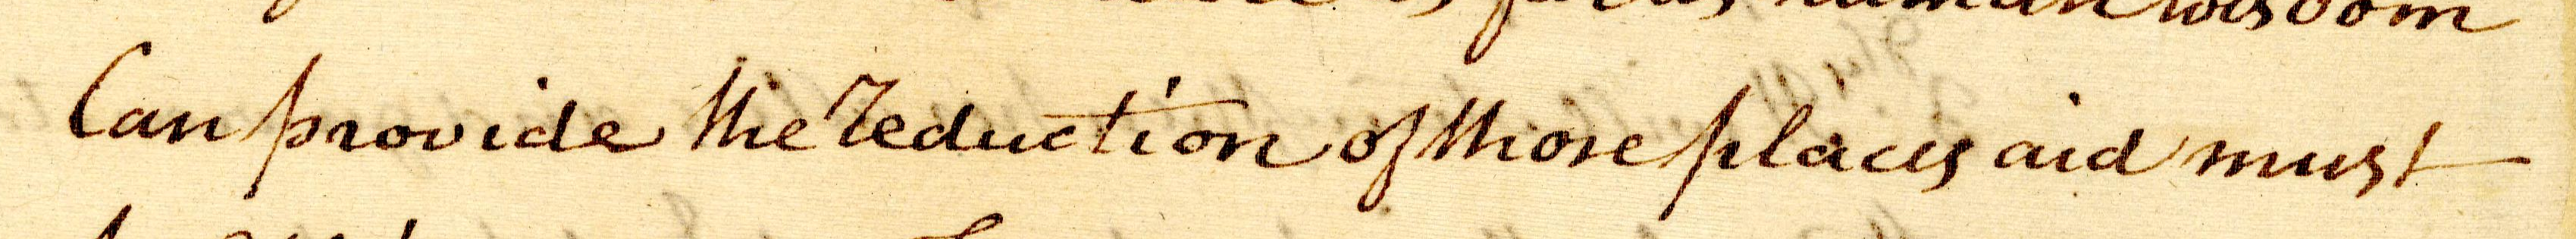Can provide the reduction of those places aid must
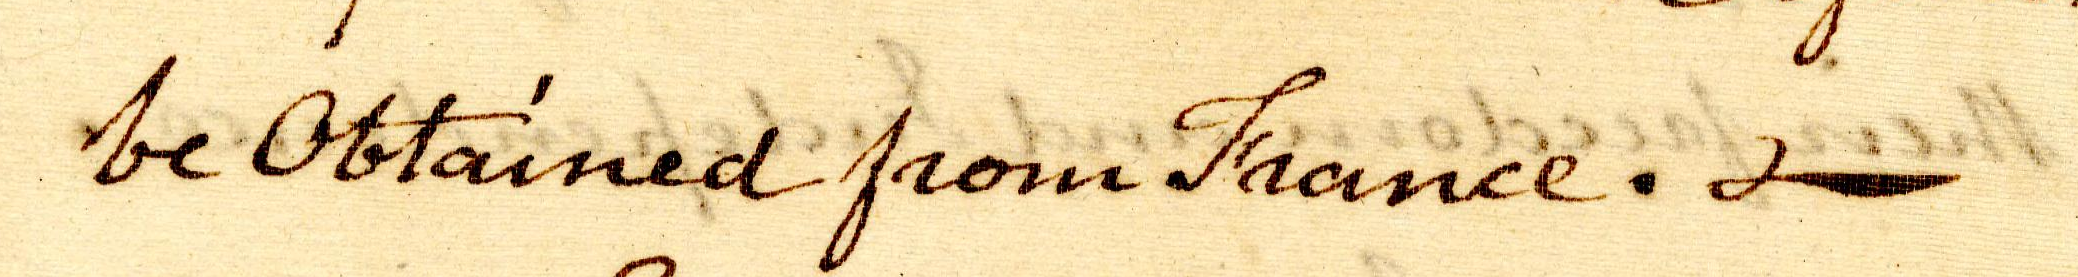be Obtained from France.-
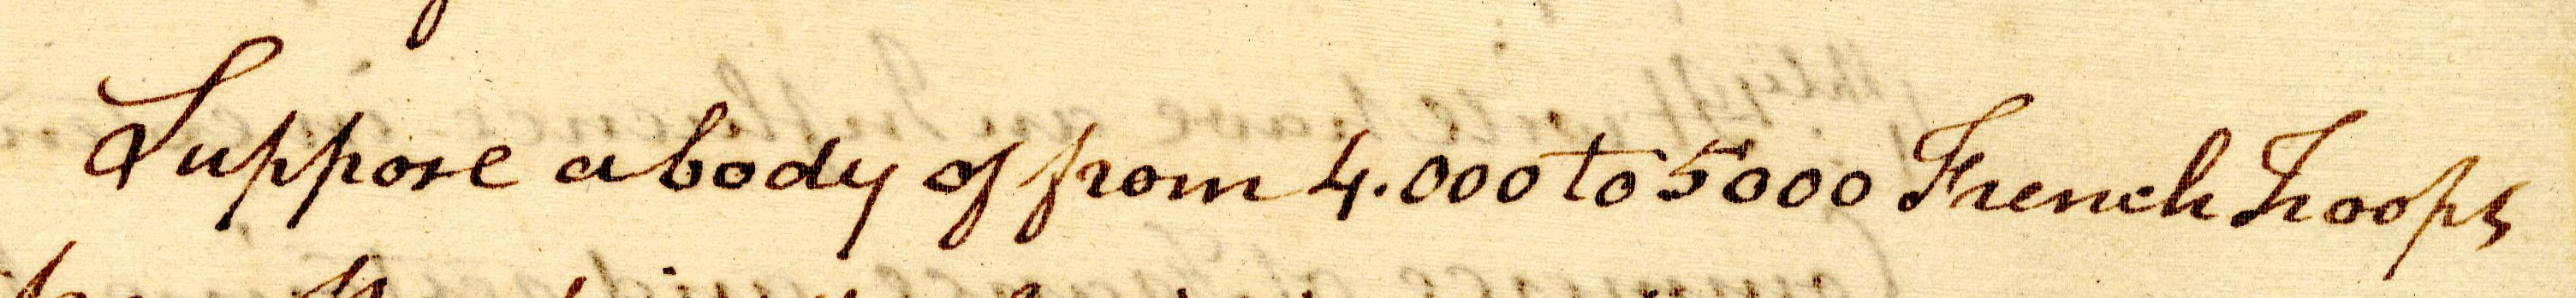Suppose a body of from 4.000 to 5000 French Troops
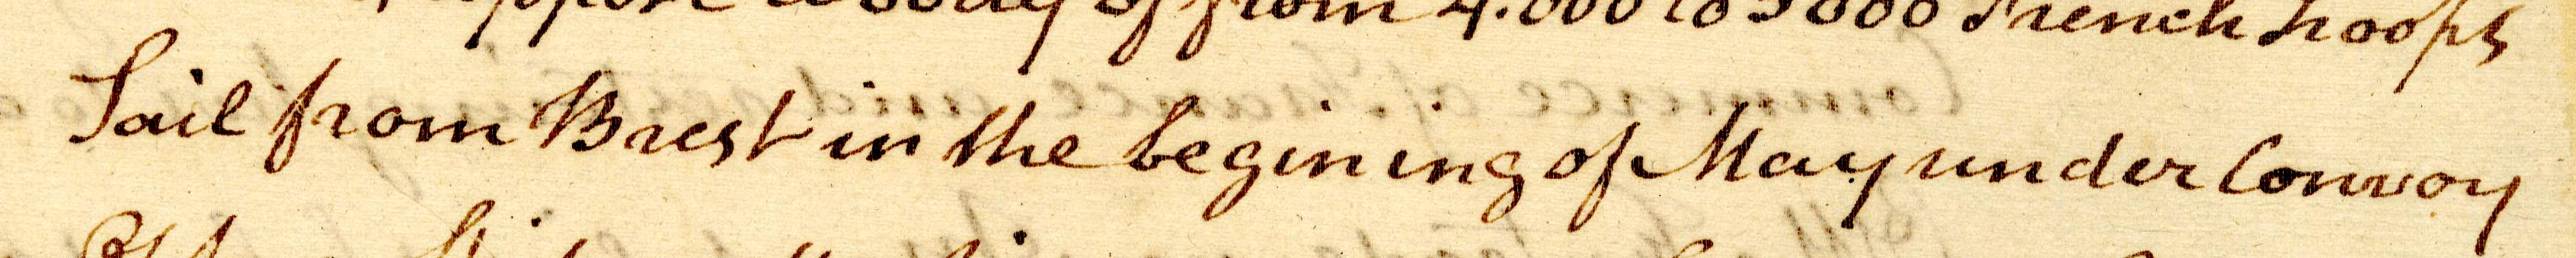Sail from Brest in the begining of May under Convoy
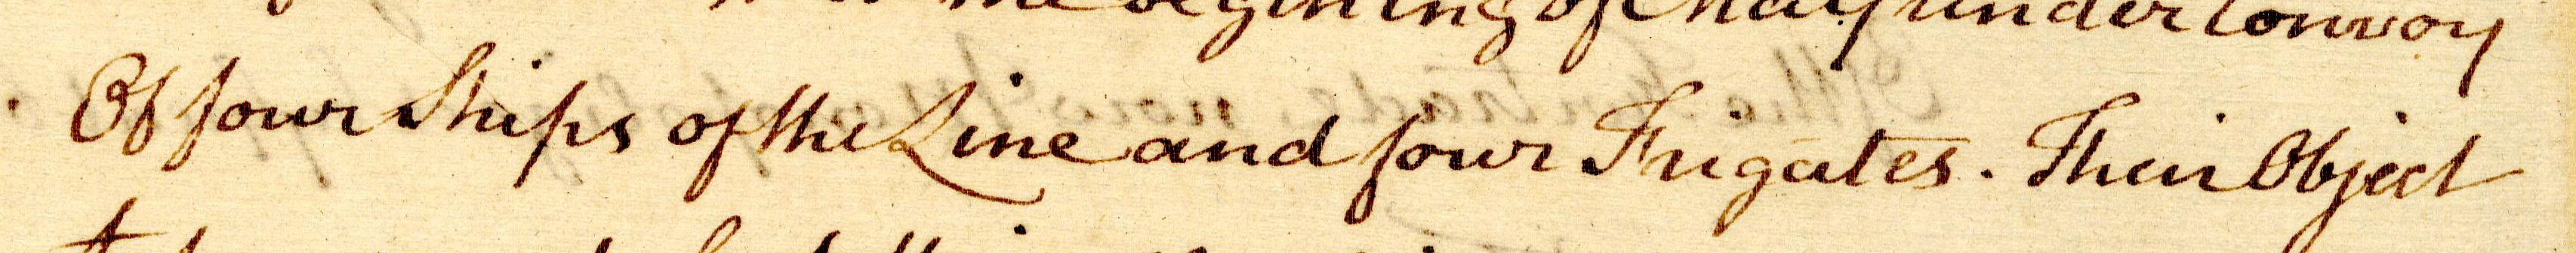Of four Ships of the Line and four Frigates. Their Object
